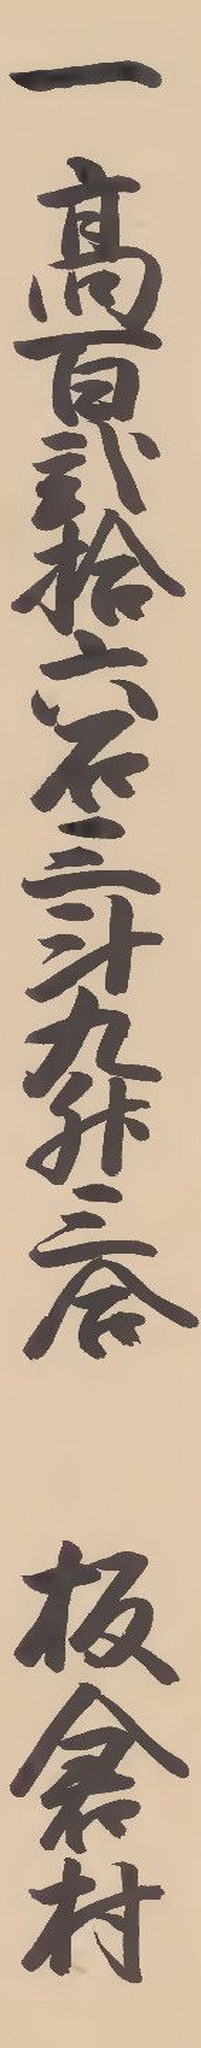一高百弐拾六石三斗九升三合板倉村
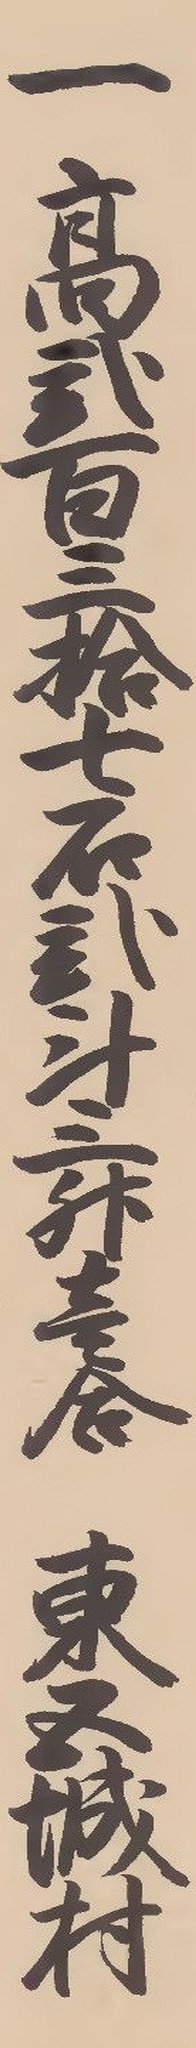一高弐百三拾七石弐斗三升壱合東五城村
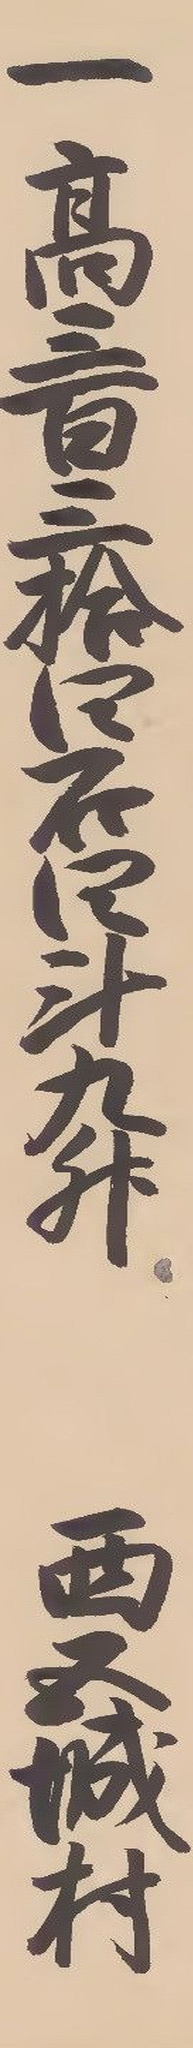一高三百三拾四石四斗九升西五城村

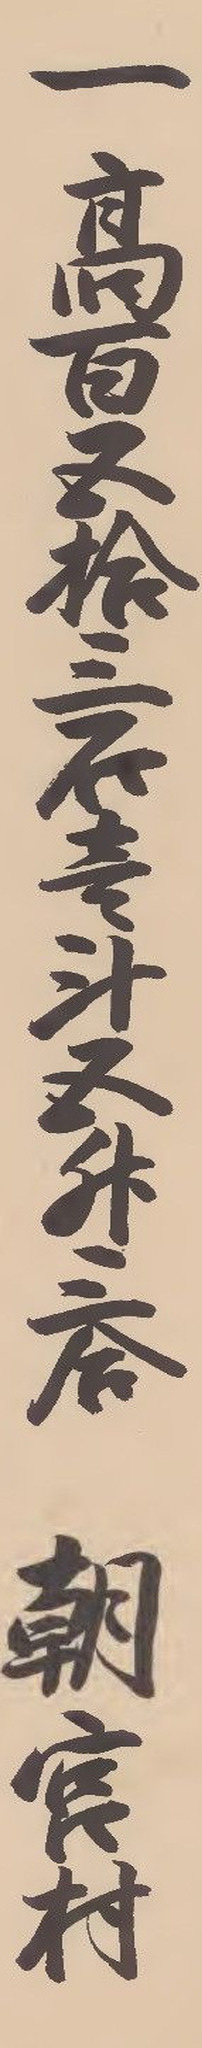一高百五拾三石壱斗五升三合朝宮村
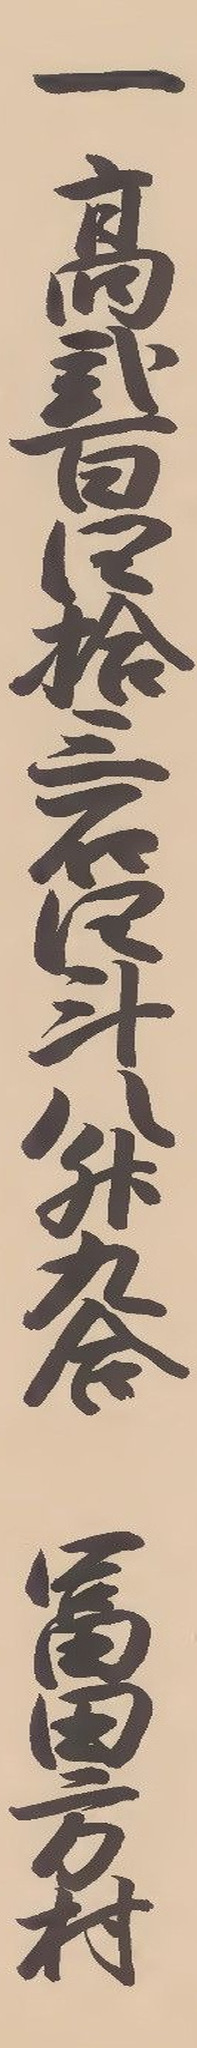一高弐百四拾三石四斗八升九合富田方村
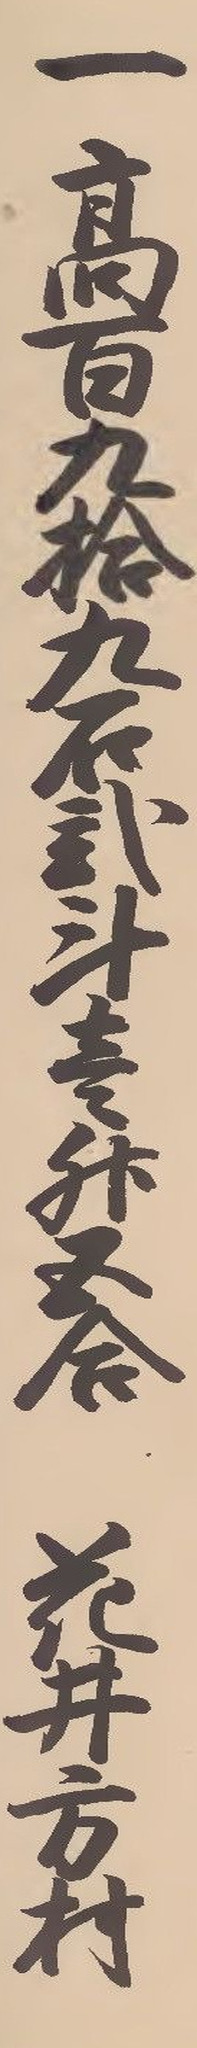一高百九拾九石弐斗壱升五合花井方村
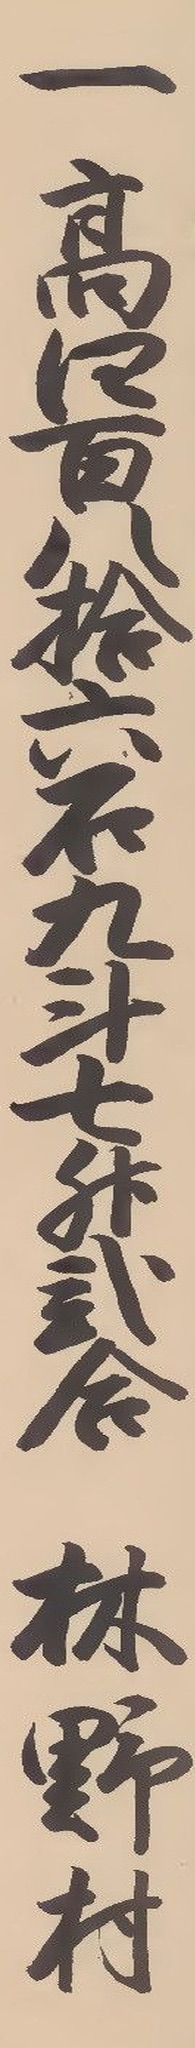一高四百八拾六石九斗七升弐合林野村
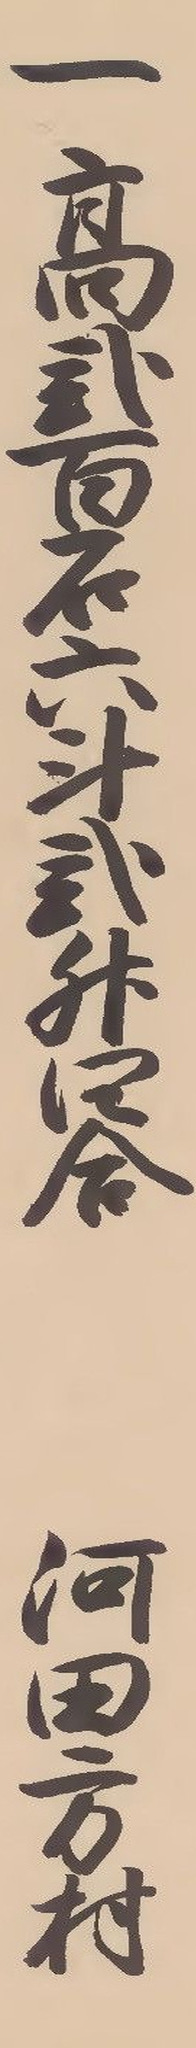一高弐百石六斗弐升四合河田方村
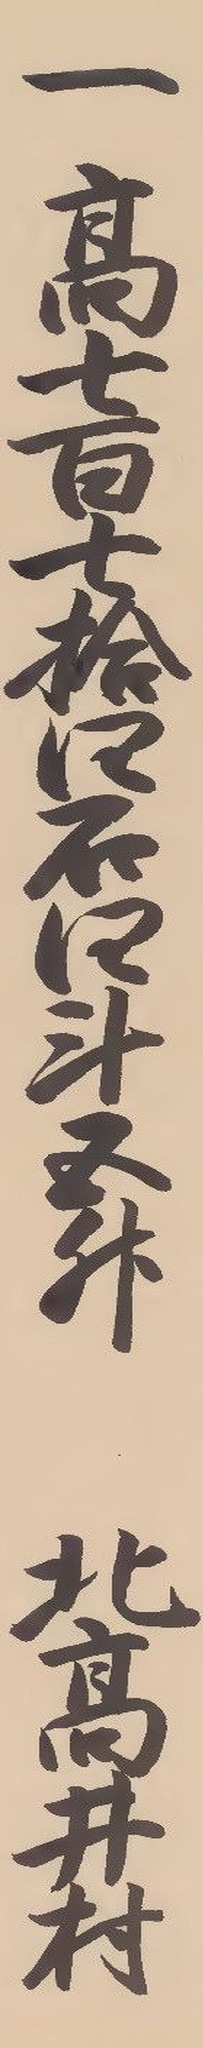一高七百七拾四石四斗五升北高井村
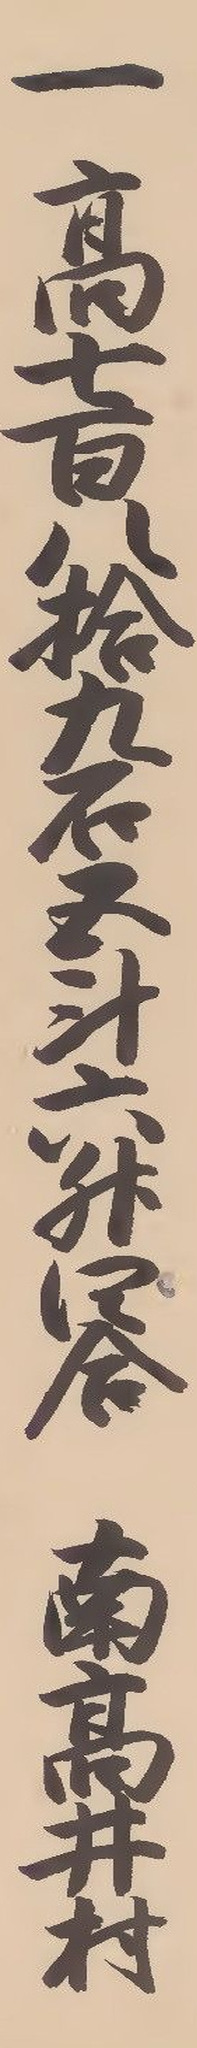一高七百八拾九石五斗六升四合南高井村

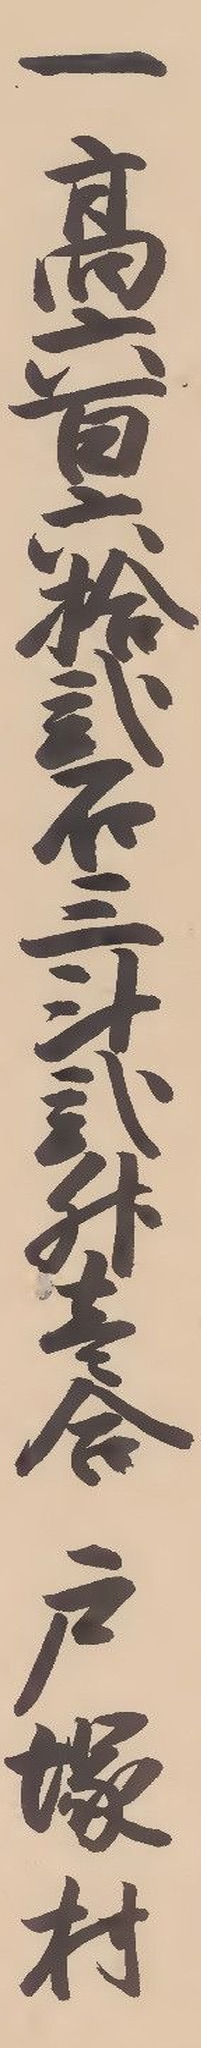一高六百六拾弐石三斗弐升壱合戸塚村
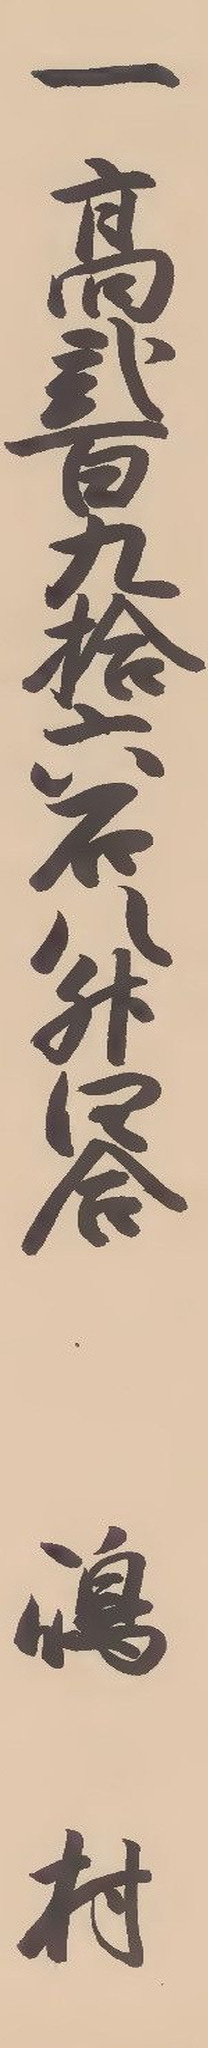一高弐百九拾六石八升四合島村
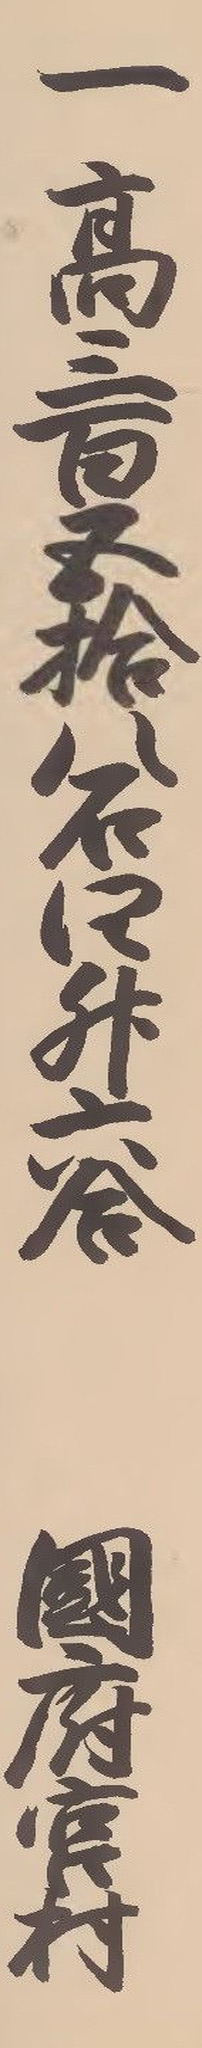一高三百五拾八石四升六合国府宮村
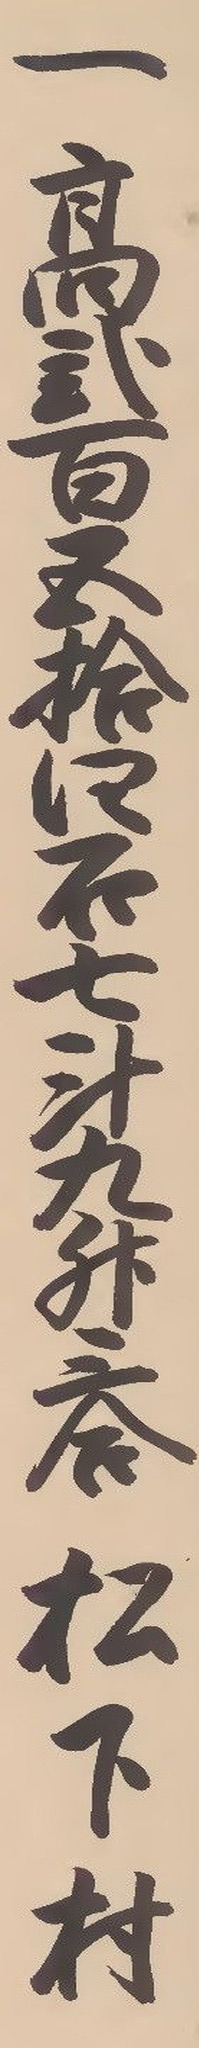一高弐百五拾四石七斗九升三合松下村
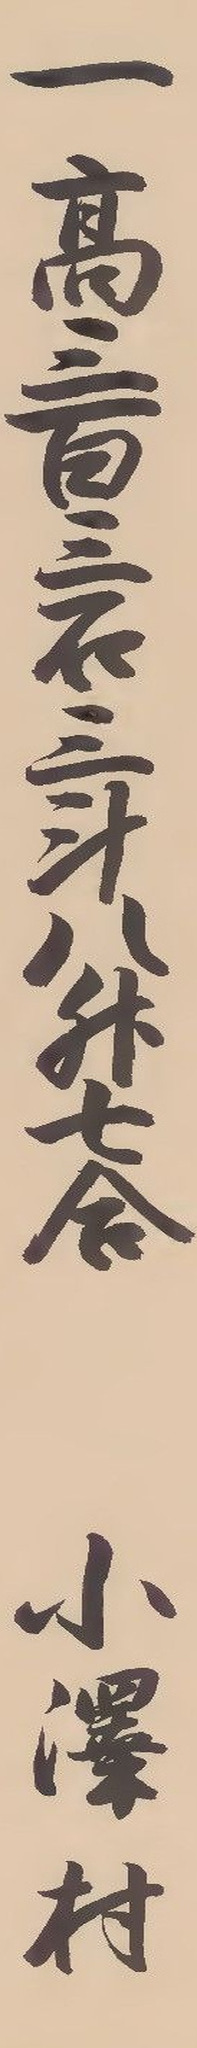一高三百三石三斗八升七合小沢村
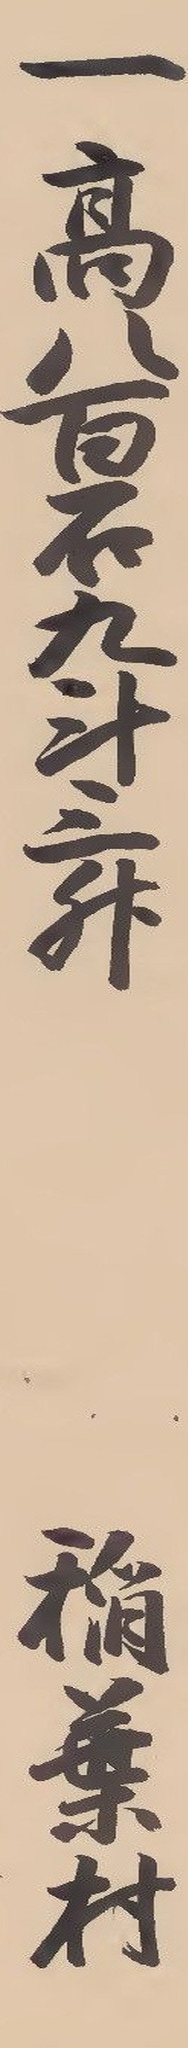一高八百石九斗三升稲葉村
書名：尾張国郷帳
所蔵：国立公文書館 National Archives of Japan
